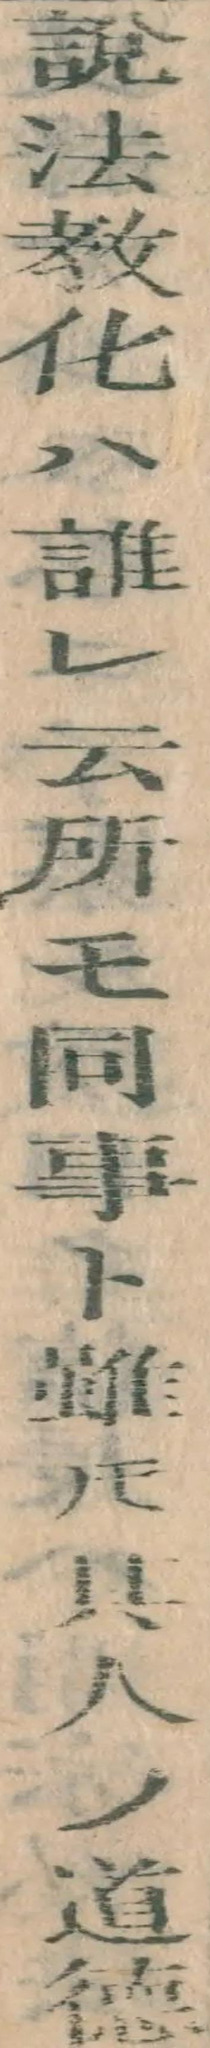説法教化ハ誰レ云所モ同事ト雖トモ其人ノ道徳
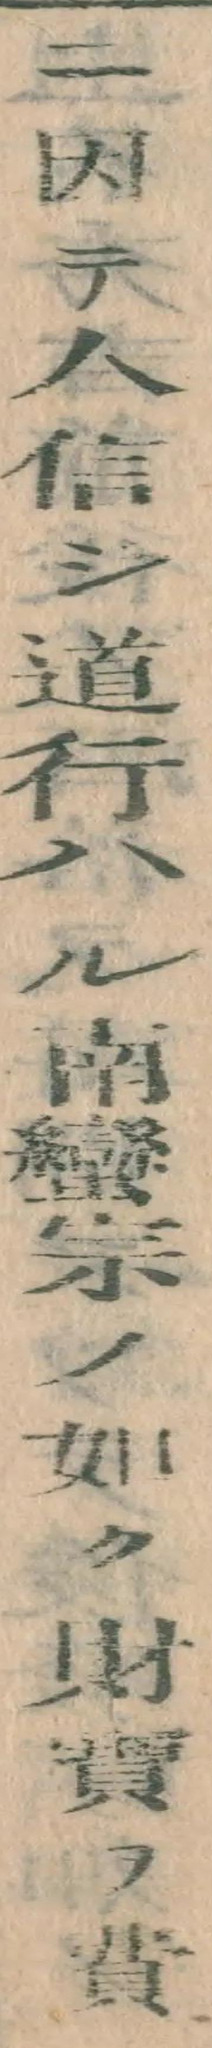二因テ人信シ道行ハル南蛮宗ノ如ク財宝ヲ費
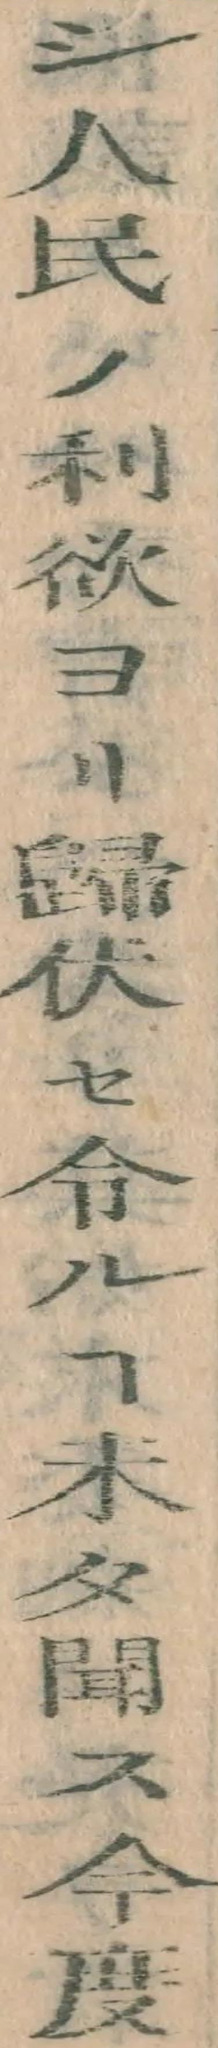シ人民ノ利欲ヨリ帰伏セ令ルヿ未タ聞ス今度
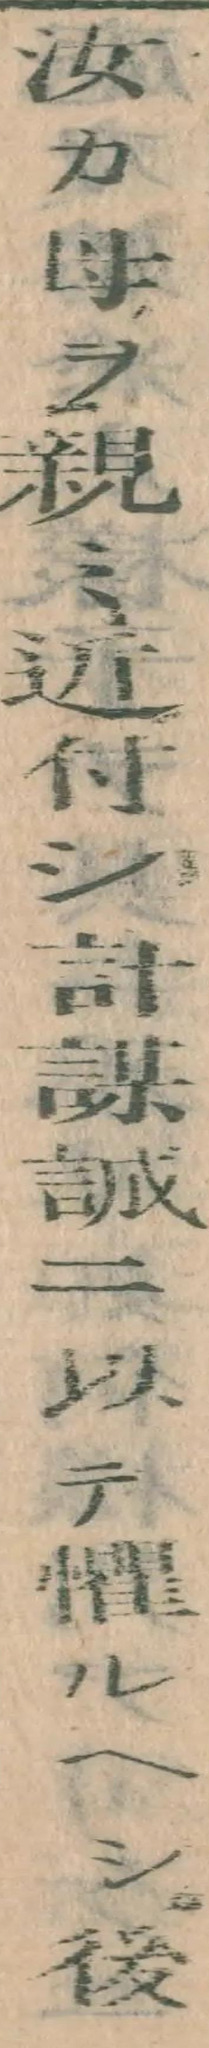汝カ母ヲ親ミ近付シ計謀誠ニ以テ懼ルヘシ後
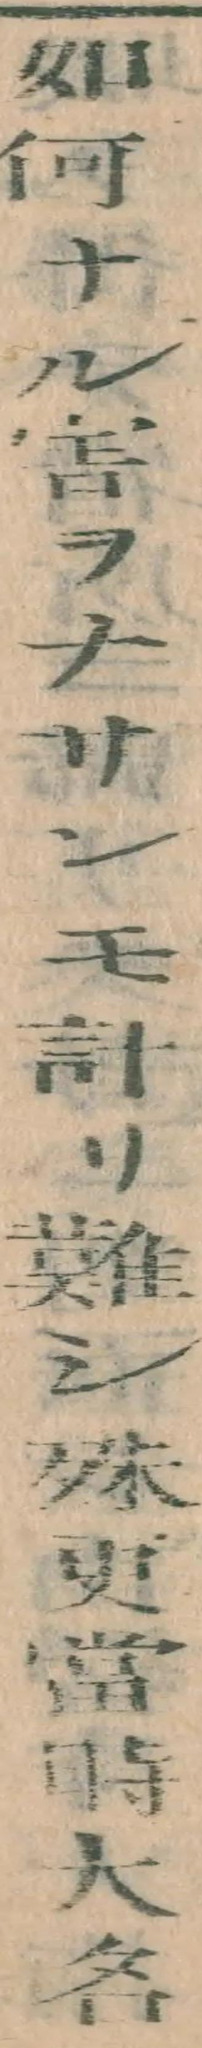如何ナル害ヲナサンモ計リ難シ殊更当時大名
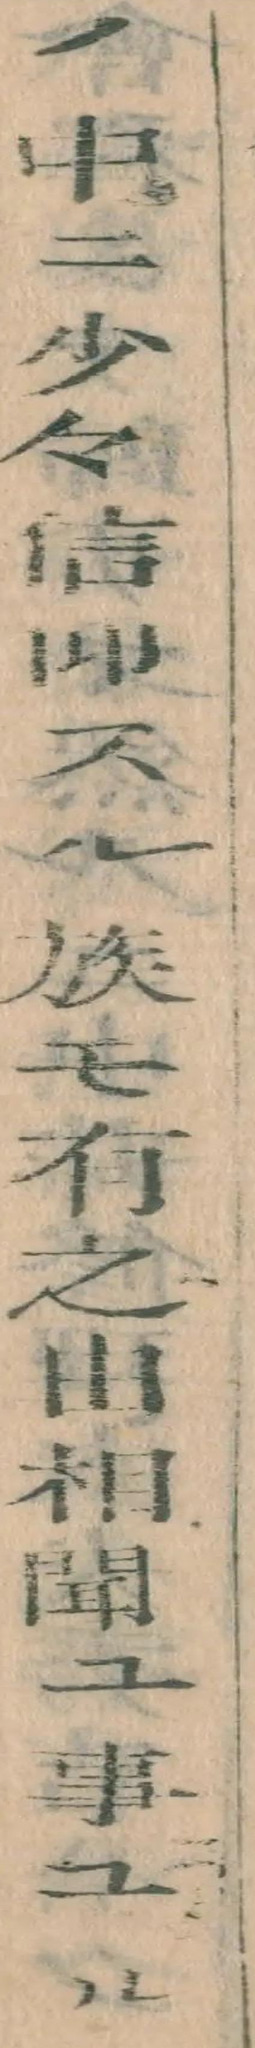ノ中ニ少々信仰スル族モ有之由相聞ユ事ユル
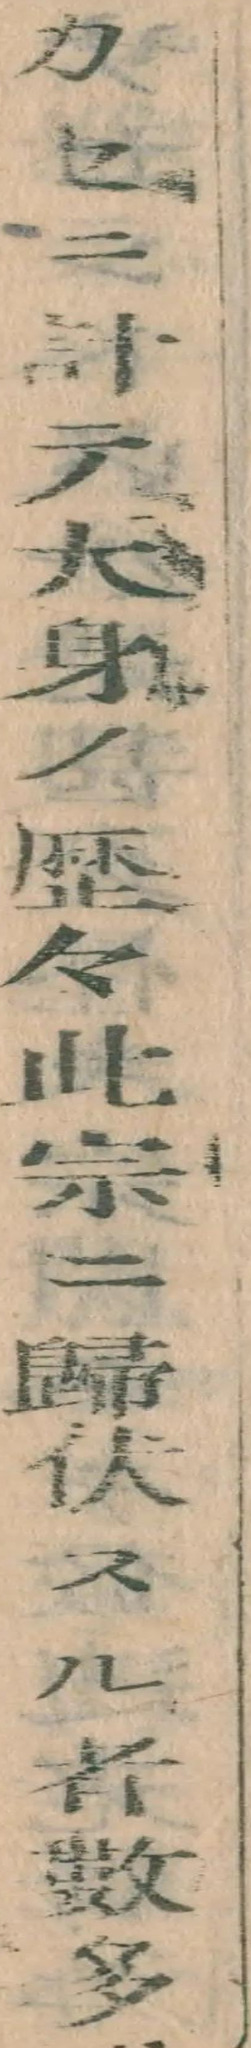カセニ計テ大身ノ歴々此宗ニ帰伏スル者数多
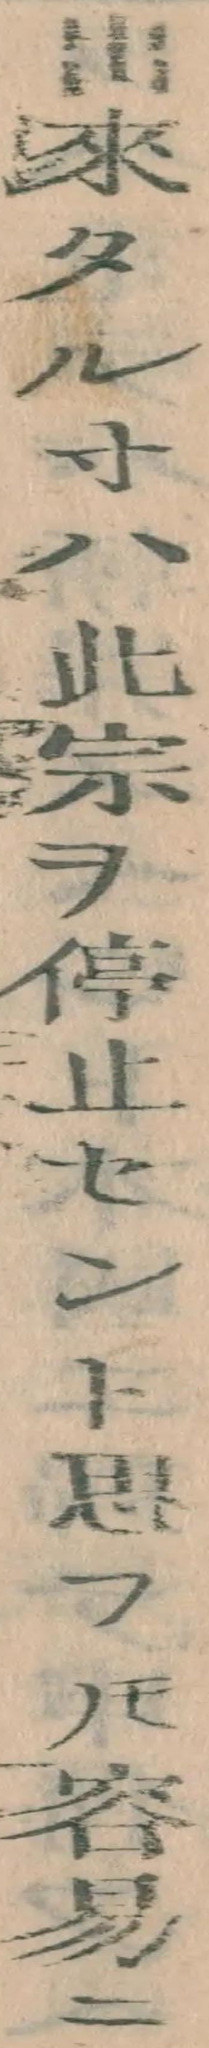出来タル寸ハ此宗ヲ停止セント思フトモ容易ニ
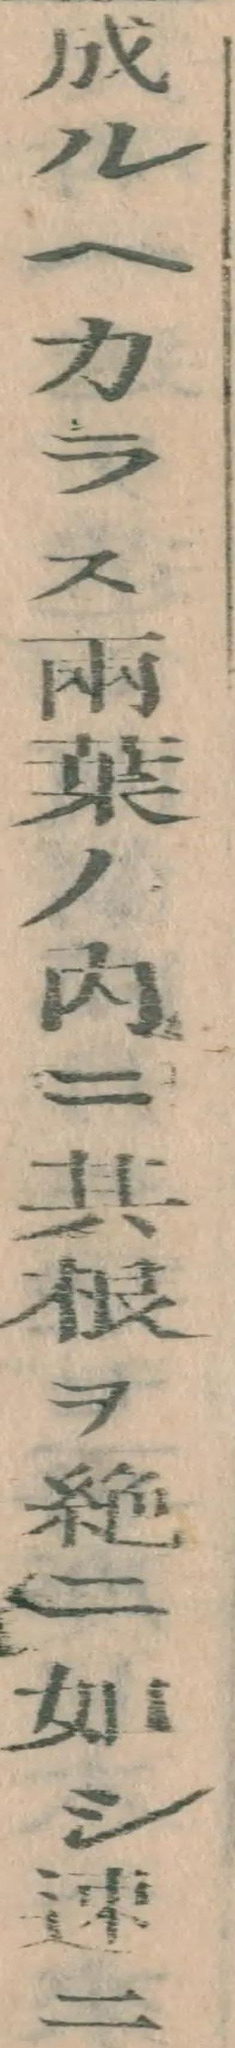成ルヘカラス両葉ノ内ニ其根ヲ絶ニ如シ速ニ
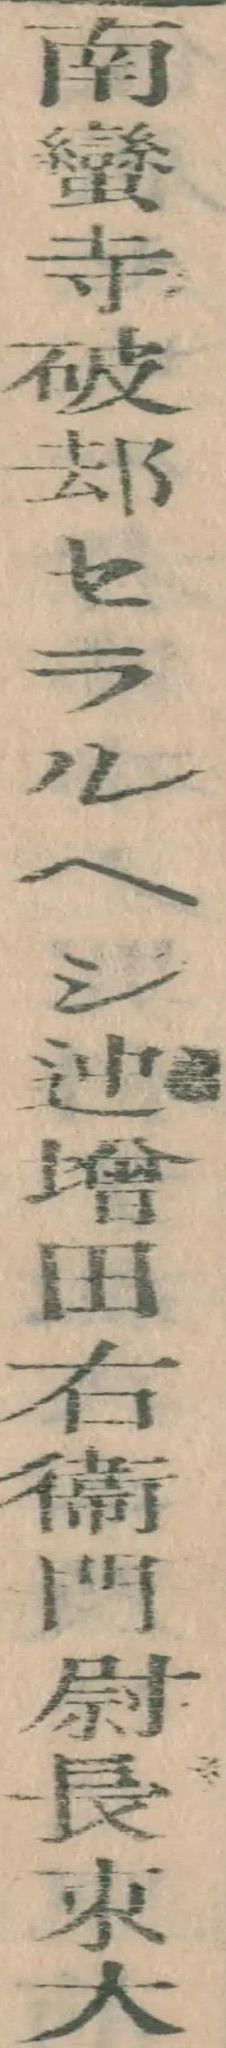南蛮寺破却セラルヘシ迚増田右衛門尉長束大
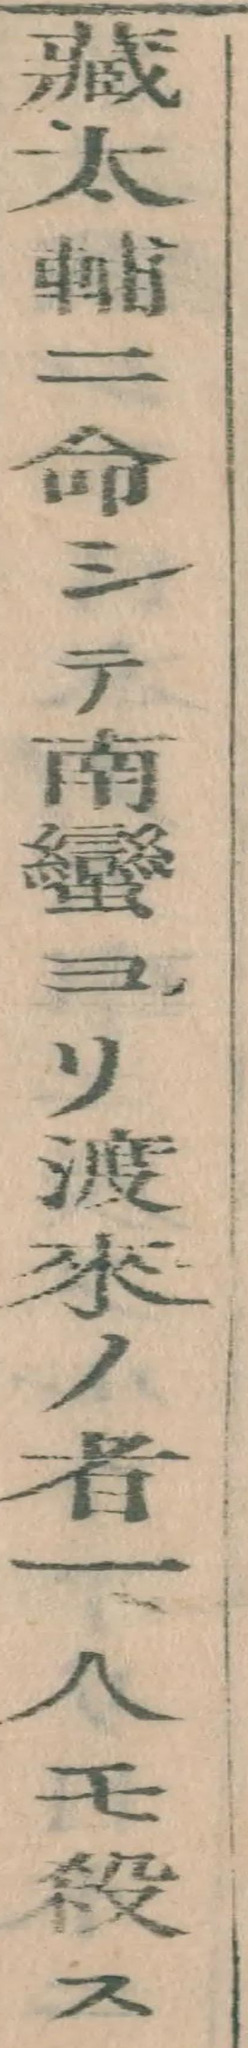蔵太輔ニ命シテ南蛮ヨリ渡来ノ者一人モ殺ス
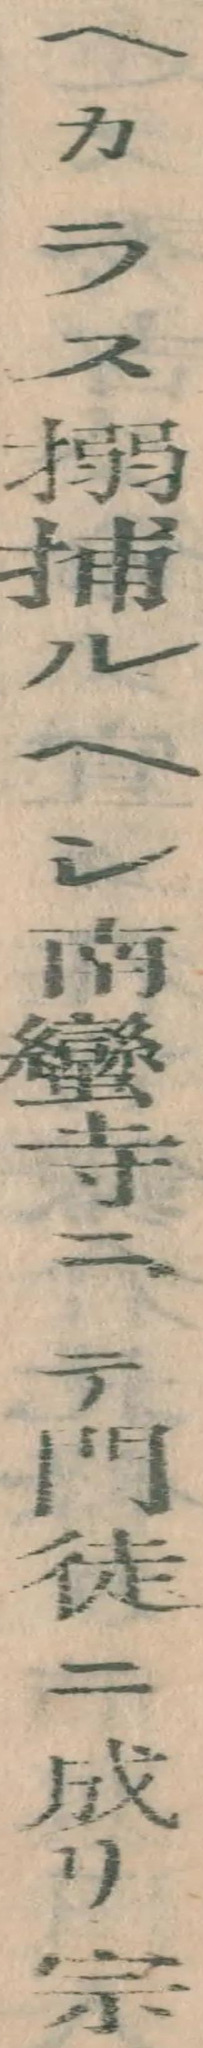ヘカラス搦捕ルヘシ南蛮寺ニテ門徒ニ成リ宗
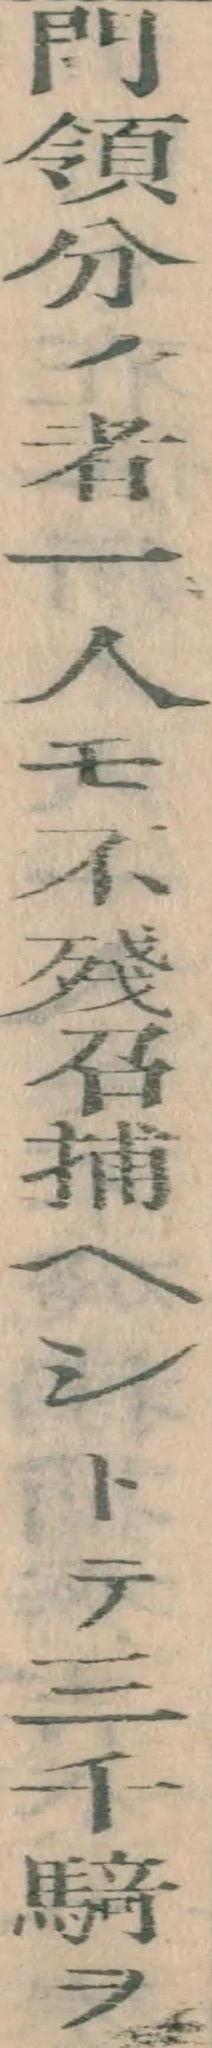門領分ノ者一人モ不残召捕ヘシトテ三千騎ヲ
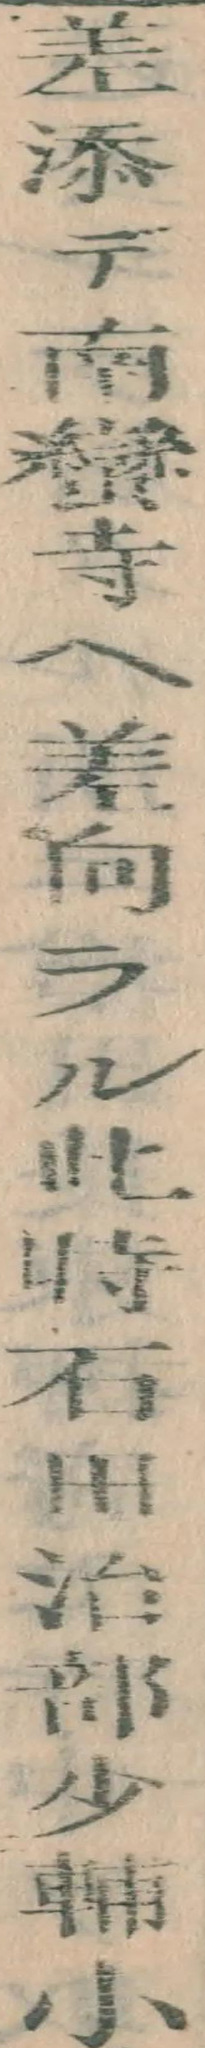差添テ南蛮寺ヘ差向ラル此時石田治部少輔小
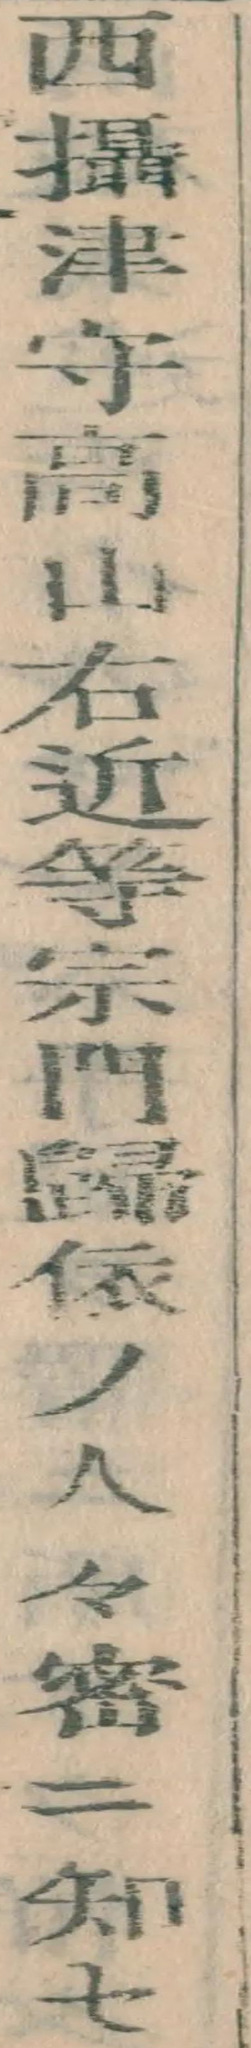西摂津守高山右近等宗門帰依ノ人々密ニ知セ
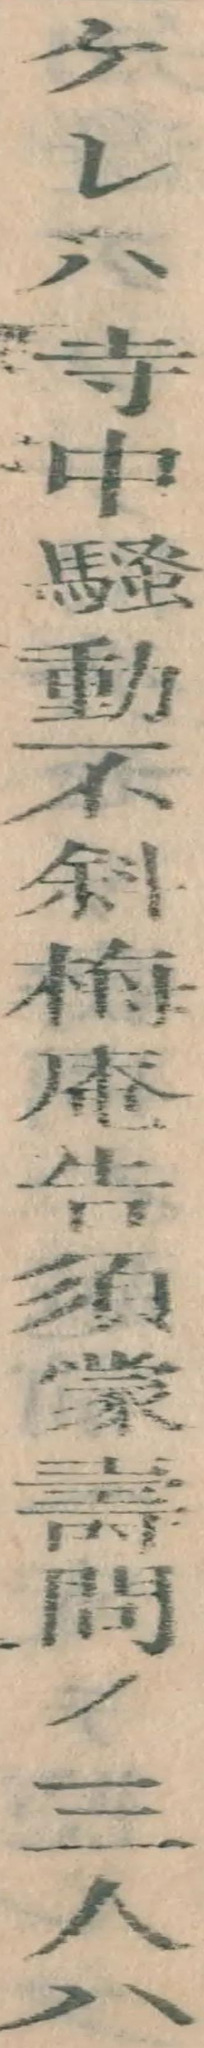ケレハ寺中騒動不斜梅庵告須蒙寿問ノ三人ハ
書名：南蛮寺興廃記
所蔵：国立国会図書館 National Diet Library, JAPAN
